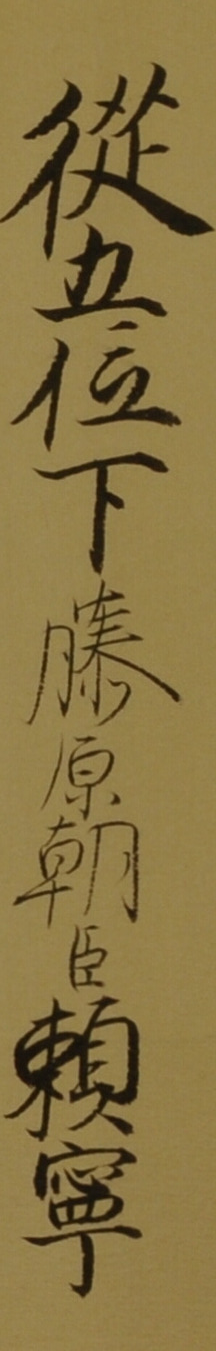従五位下藤原朝臣頼寧
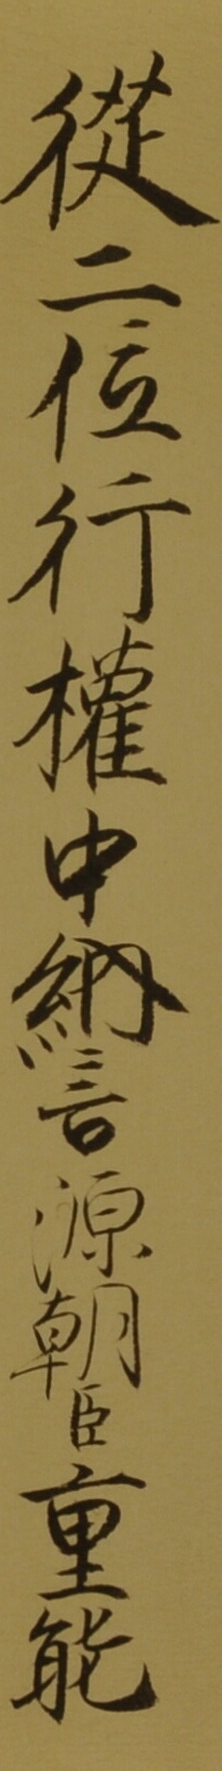従二位行権中納言源朝臣重能
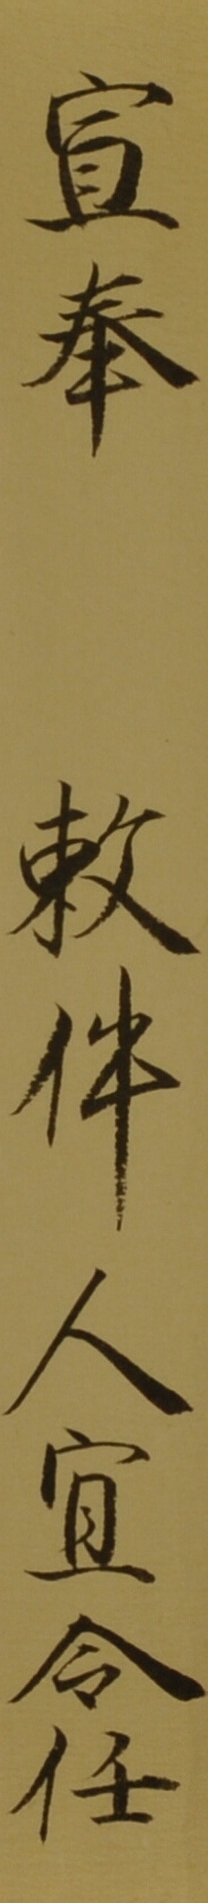宣奉敕件人宣令任
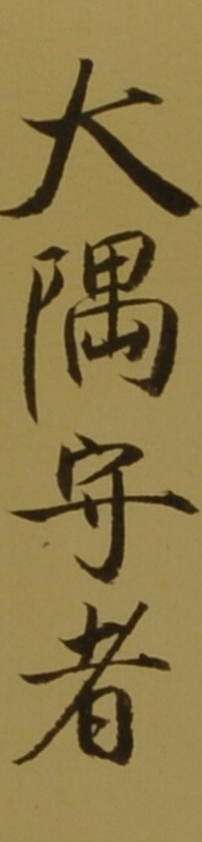大隅守者

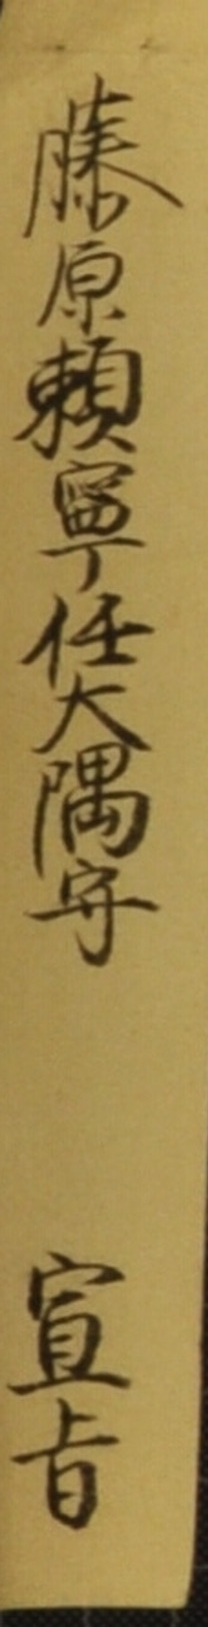藤原頼寧任大隅守宣旨
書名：口宣案・宣旨・位記
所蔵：伊那市立高遠町図書館・合同会社AMANE
